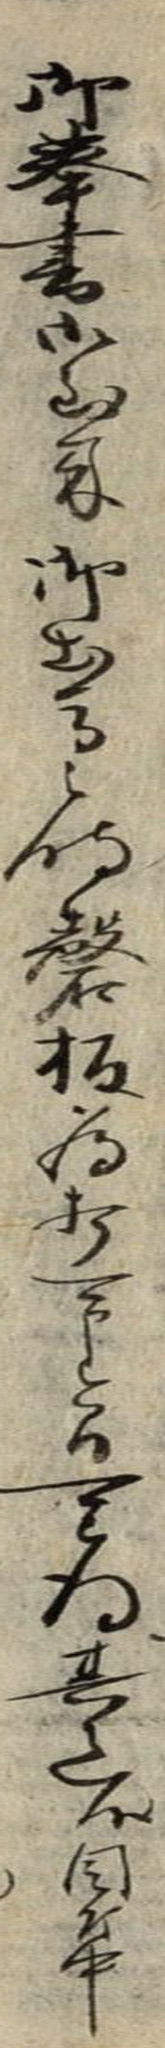一御奉書御到来御出馬之時磬板為打可申候間可被得其意候目付中
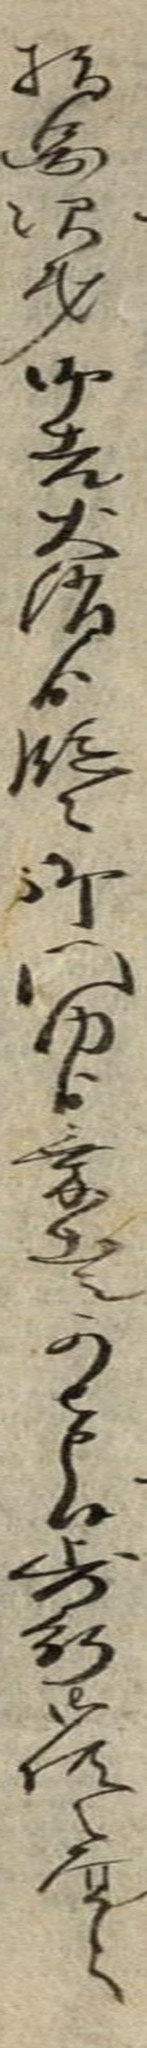指図次第御先火消ゟ段々御門内ゟ乗出し可被申候歩行御供之面々
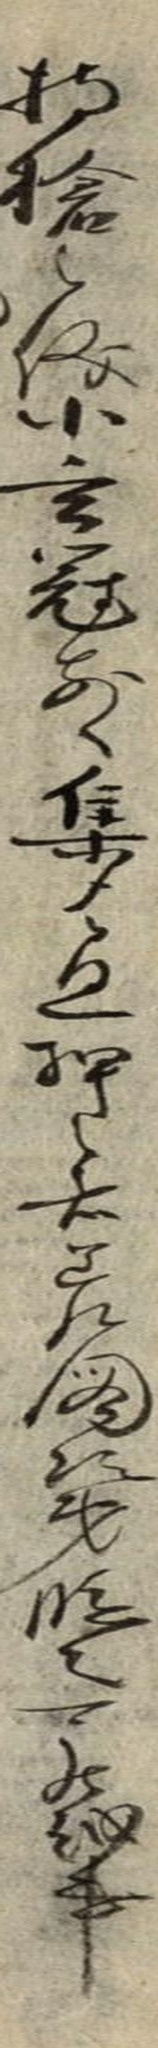持槍之儀小玄冠前へ集め置押之者差図次第段々可罷越事
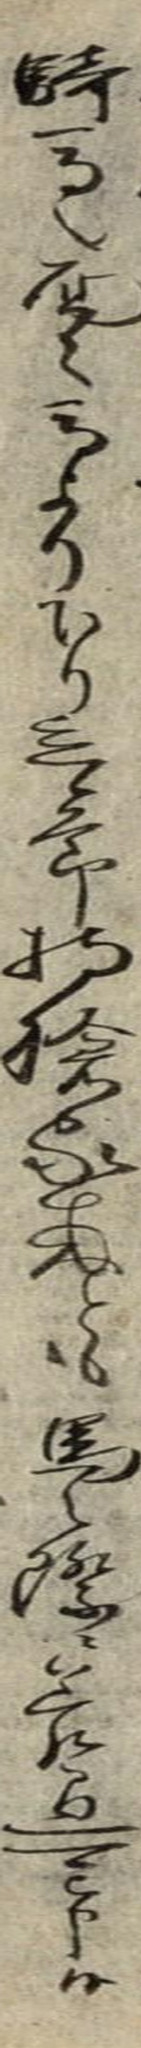一騎馬之面々馬より下り立候節持槍家来とも馬之際に差置可被申候
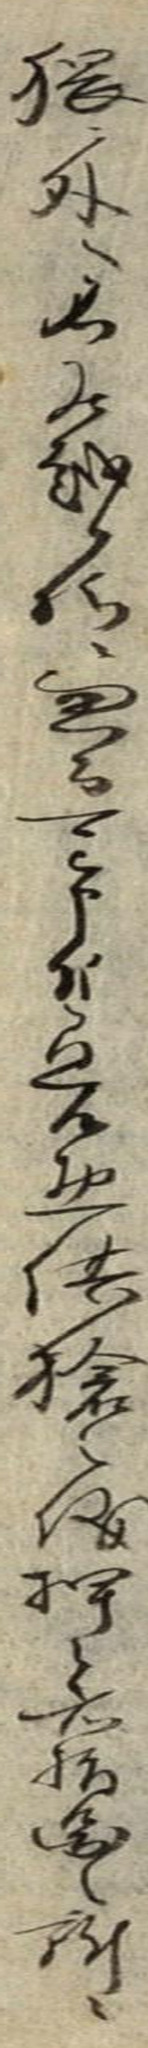猥に外へ不罷越候様に兼て可被申付置候惣供槍之儀押之者指図之所に
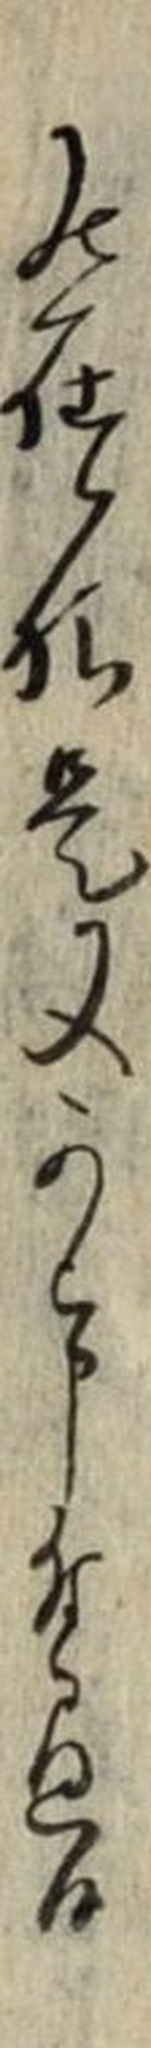罷在候様是又可被申付置候
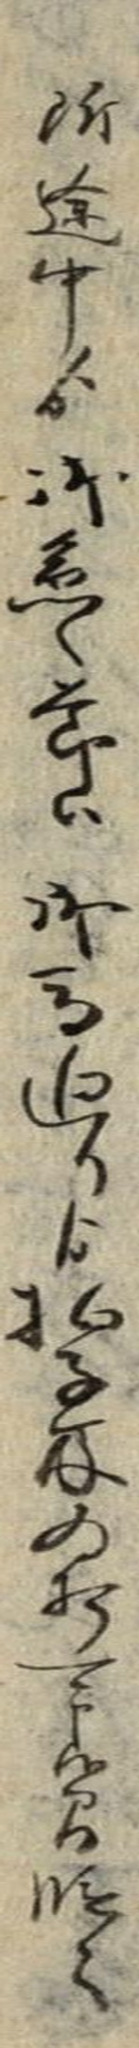附途中ゟ御急之節は御馬廻りゟ拍子木為打可申候間段々
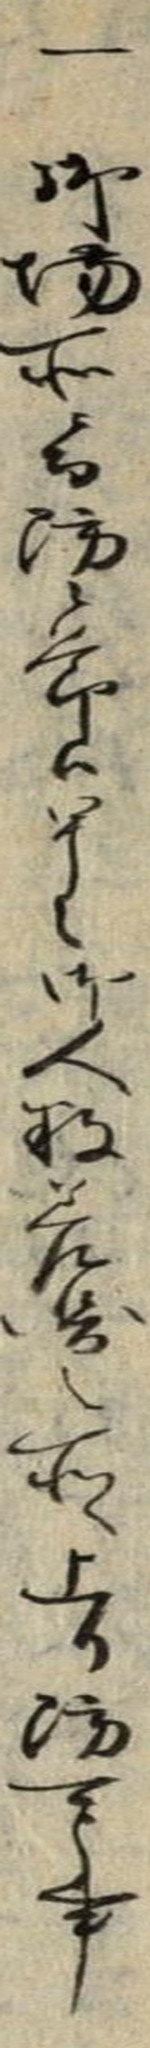一御場所にて防候節は早々御人数差図之所へ上り防可申事
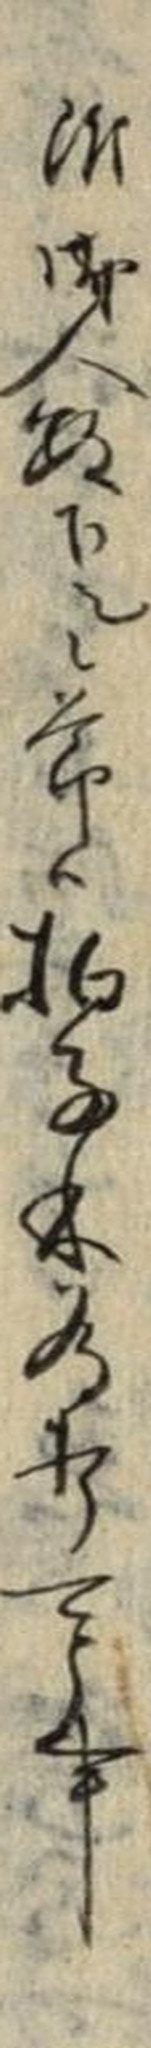附御人数下し候節は拍子木為打可申事
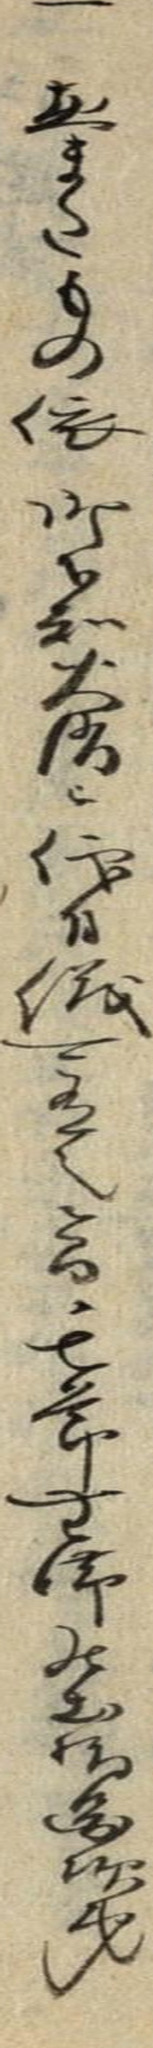一惣またもの依御下知火消被仰付儀可有之候間其節無滞罷出指図次第
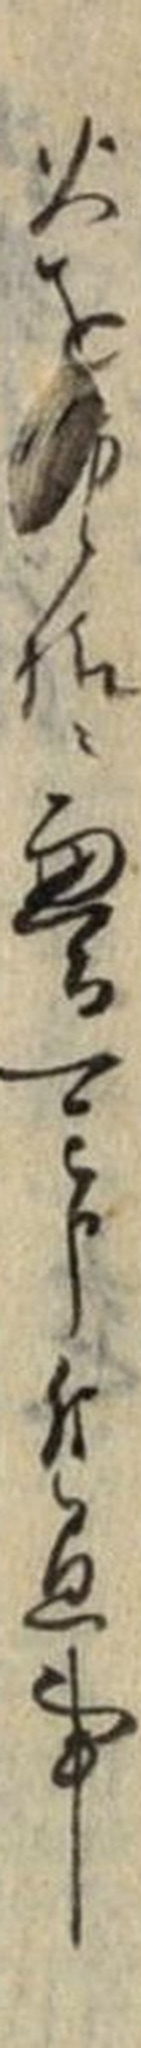火を候様に兼て可被申付置事
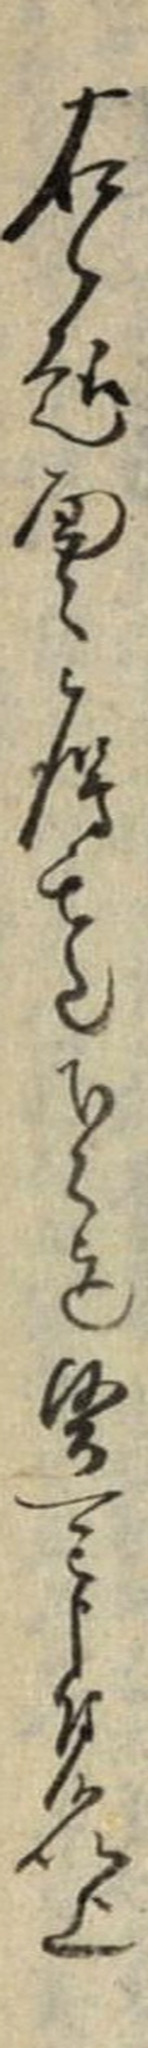右之趣面々被得其意下々迄堅可被申付候以上
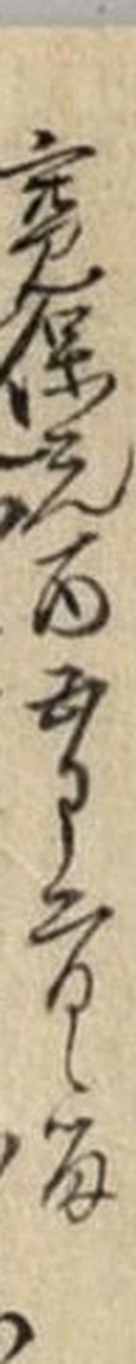享保元酉五月二日之留
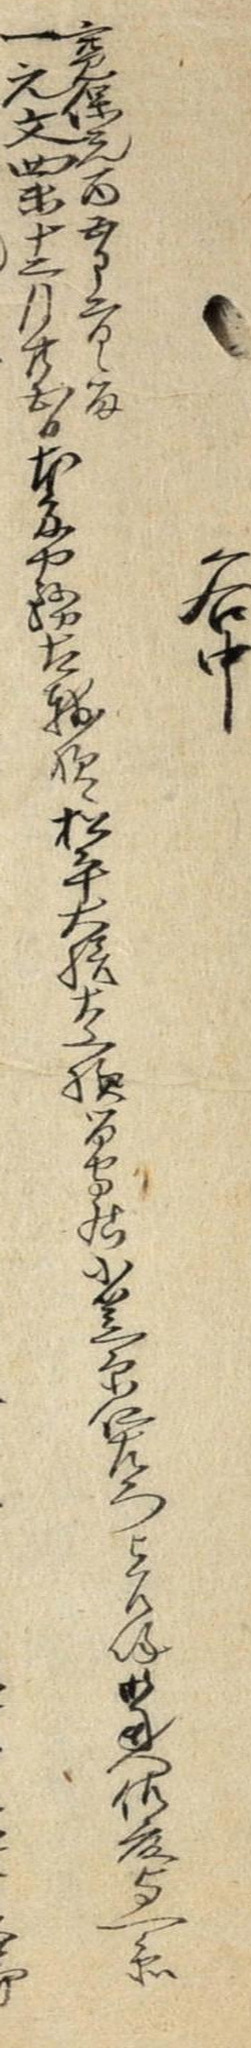一元文四未十二月廿五日本多中務大輔様へ松平大膳大夫様留守居小笠原仁左衛門被召呼御用人佐藤与一兵衛
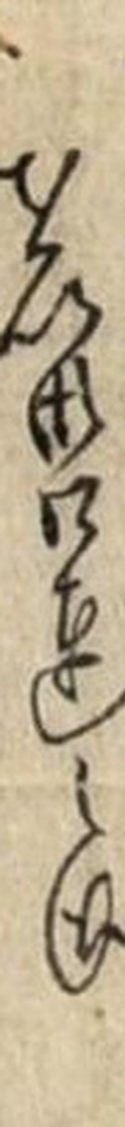を以御口達之趣
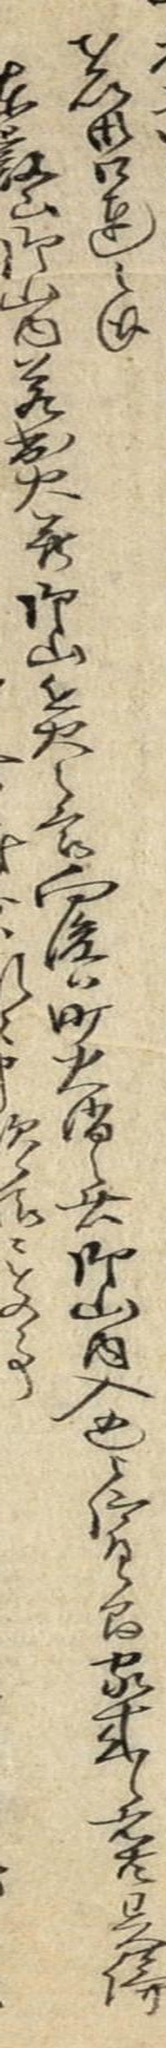△東叡山御山内若出火并御山近火之節向後は町火消之者御山内入込被仰付候間家来之者共異論
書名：三都并道中之部
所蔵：福井県文書館 Fukui Prefectural Archives
